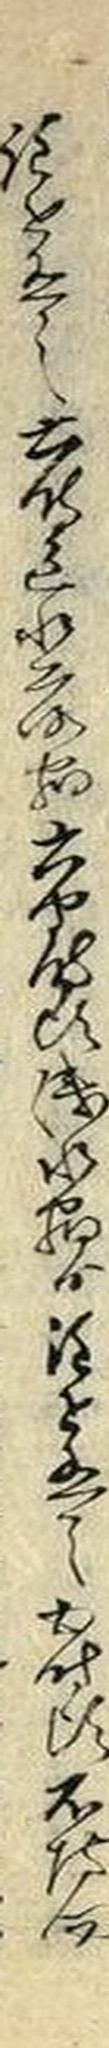注進有之六時過水落宿六半時頃淺水宿ゟ注進有之五時頃石場問
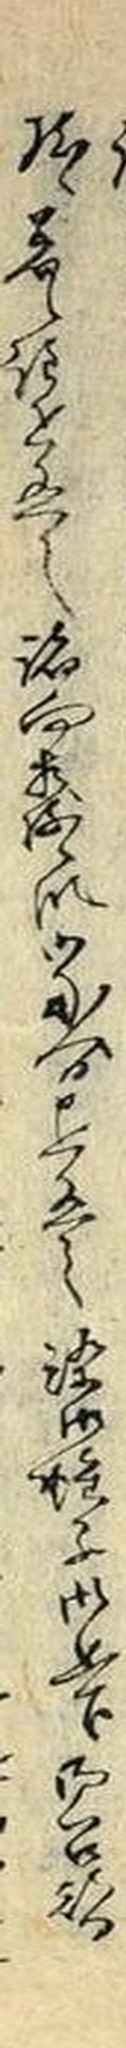屋へ着候注進有之諸向相除候段御用人中ゟ申上有之染御帷子御上下御召替
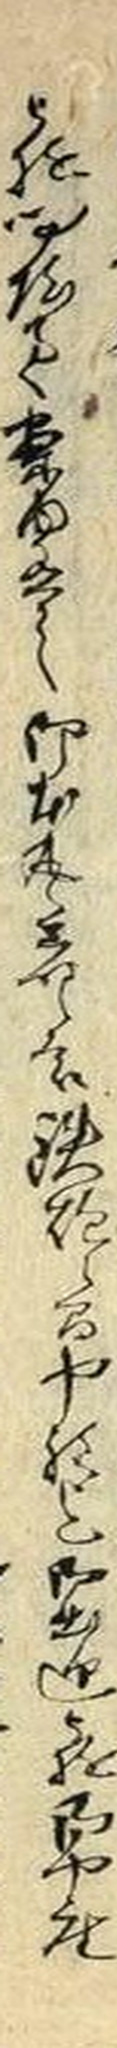被遊問屋方へ案内有之御本丸へ着之節鉄炮之間中程迄御出迎被遊御中座
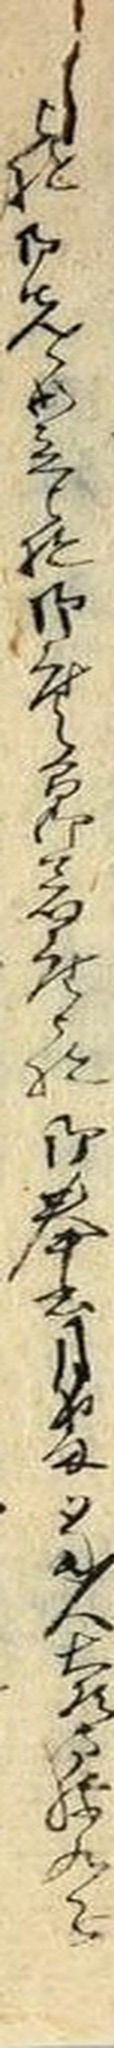御先へ御立被遊御座之間御着座被遊御奉書月番御用人大道寺孫九郎
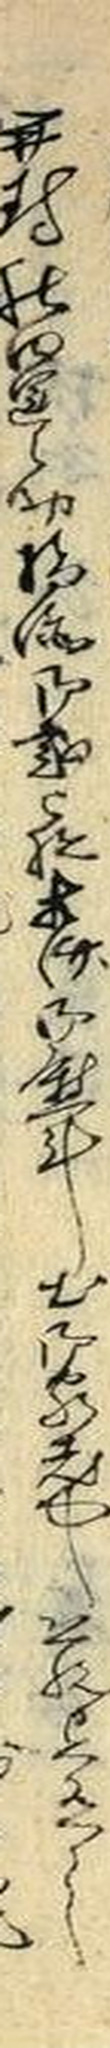開封秋田運之助指添御戴被遊相済御熨斗出御家老中恐悦申上有之
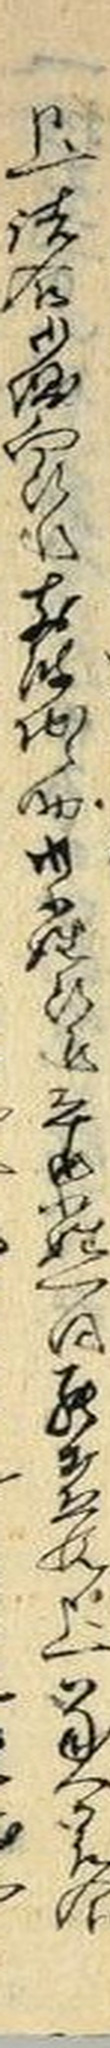申上詰合御側向頭取前波他之助御小姓頭取平御小姓一同罷出恐悦申上御用人御取合
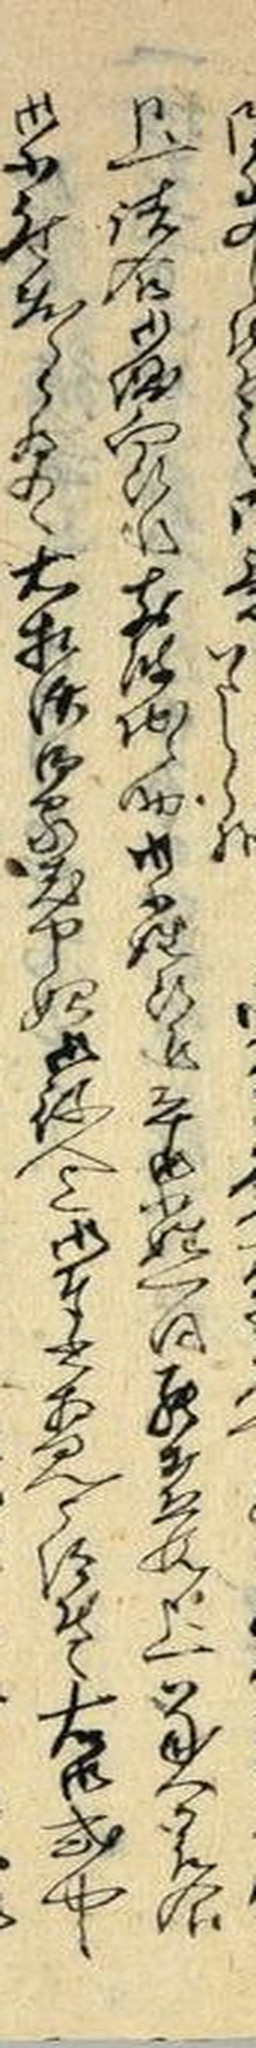御小座敷へ被為入候右相済御家老中始御役人迄御奉書拝見被仰付候右御式中
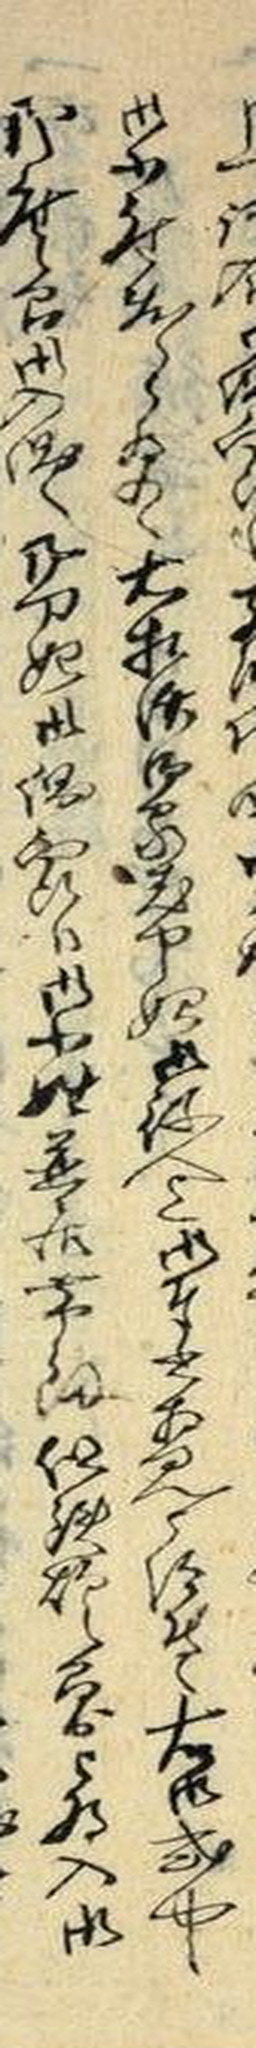御座之間御入側へ御刀始御側向頭取御小姓並居帯釼但鉄炮之間ゟ被為入御
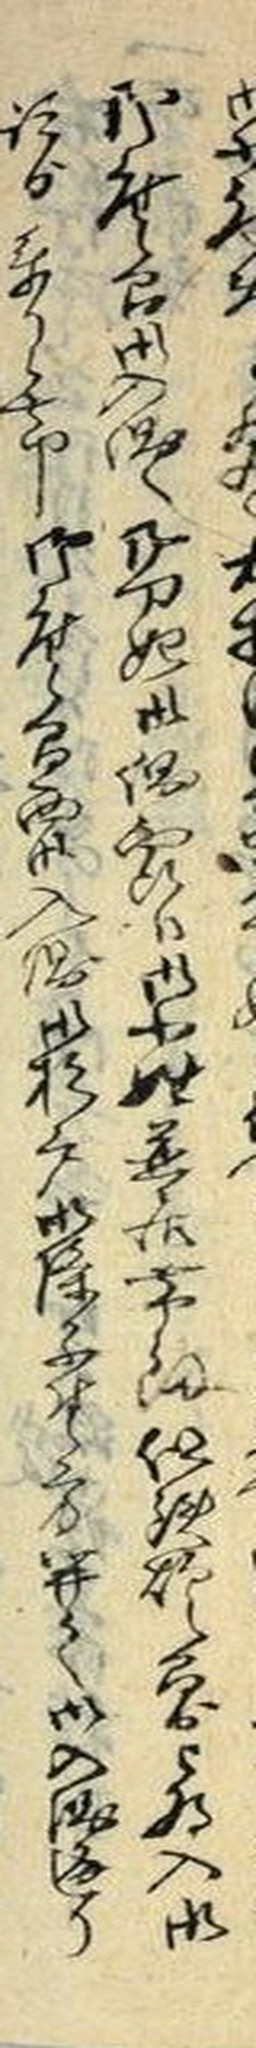跡ゟ参り候節御座之間西御入側御杉戸御障子付之方開之御入側通り
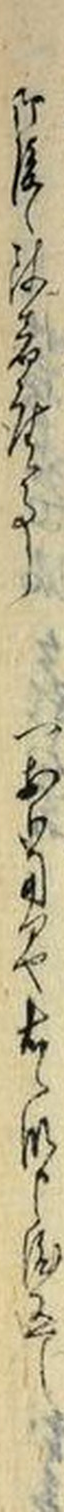御後へ致着座候事一於御用部や右之段申渡有之
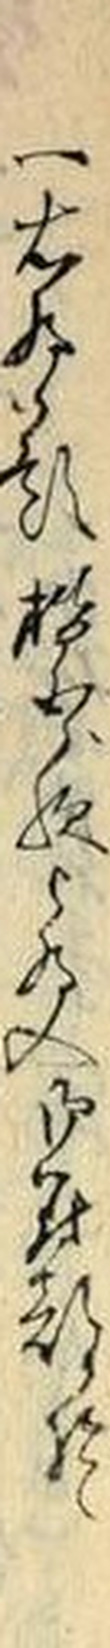一右為御歓揩五郎様被為入御対顔被遊候
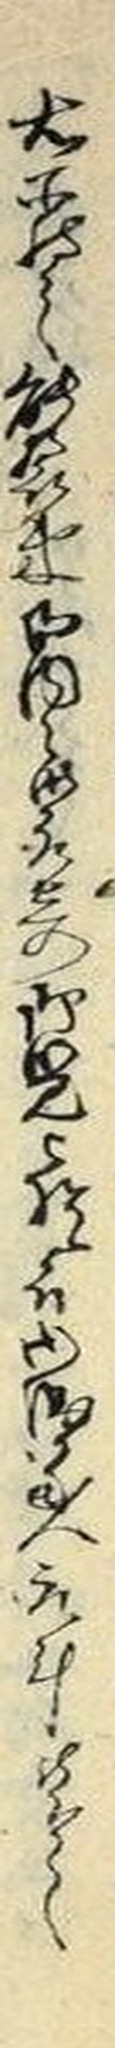右所持之能装束御内々御取寄御覧被遊候二付御側御用人取斗被下之
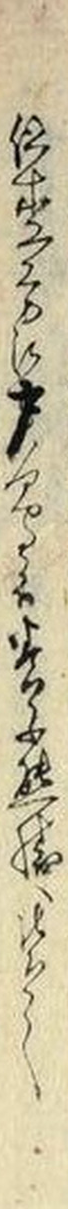但木工方江戸留守ニ付養子熊勝へ被下之
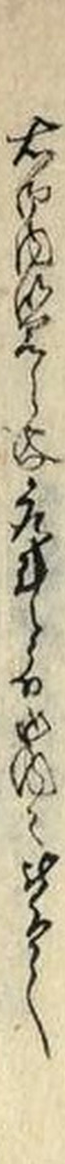右御内覧之儀取斗候ニ付御内々被下之
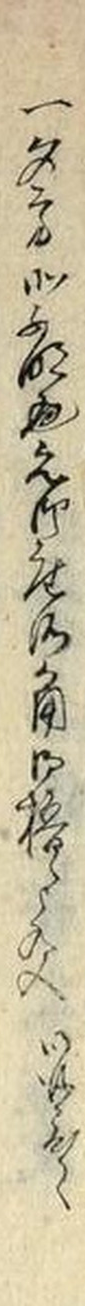一夕方北不明通元御座所角御櫓へ被為入以後度々
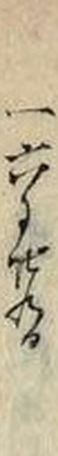一六月廿九日
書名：少傅日録抄（斉承付側向頭取日記、在国）
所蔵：福井県文書館 Fukui Prefectural Archives
